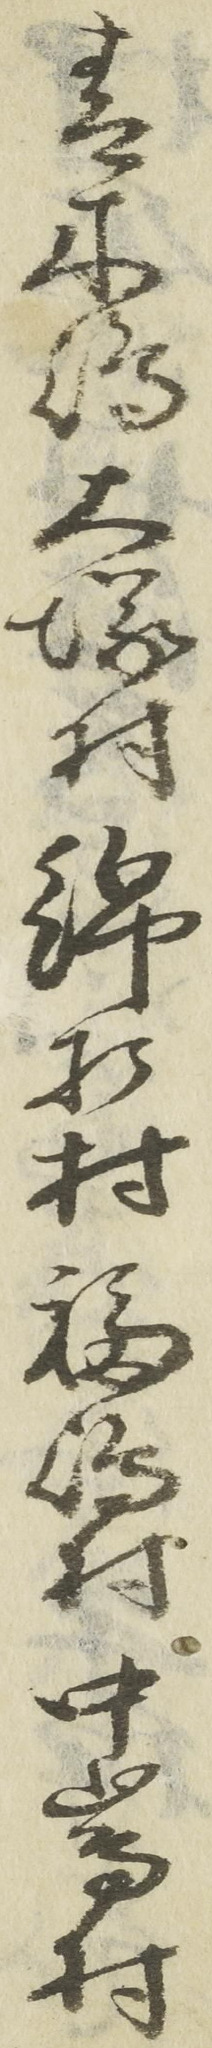青木嶋大塚村綿打村福嶋村中嶋村
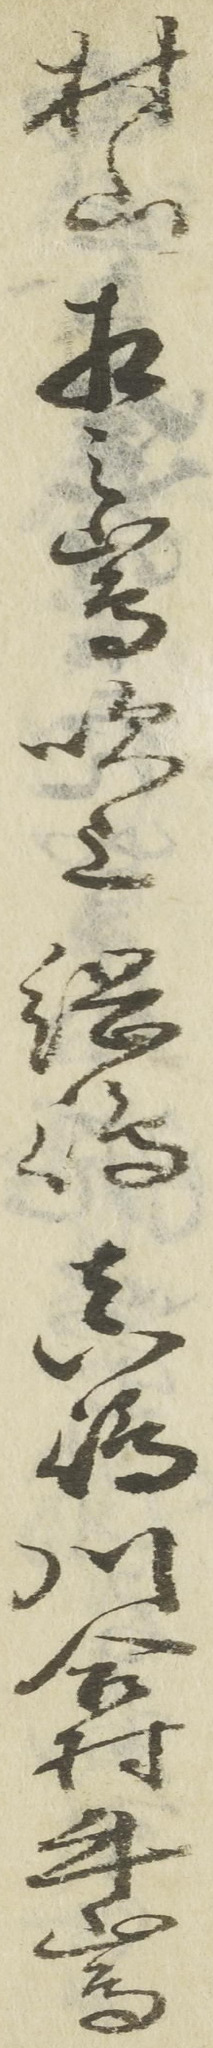村山相之嶋吹上綱嶋真嶋川合村牛嶋
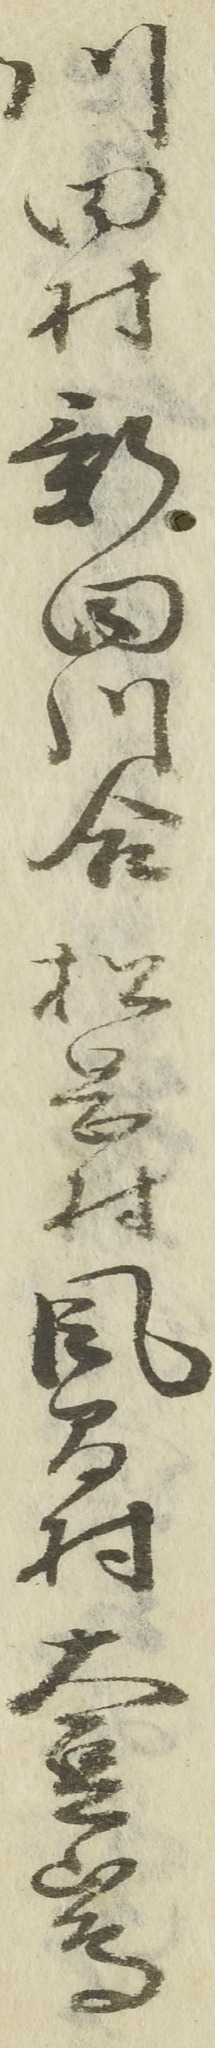川田村新田川合松岡村風間村大豆嶋
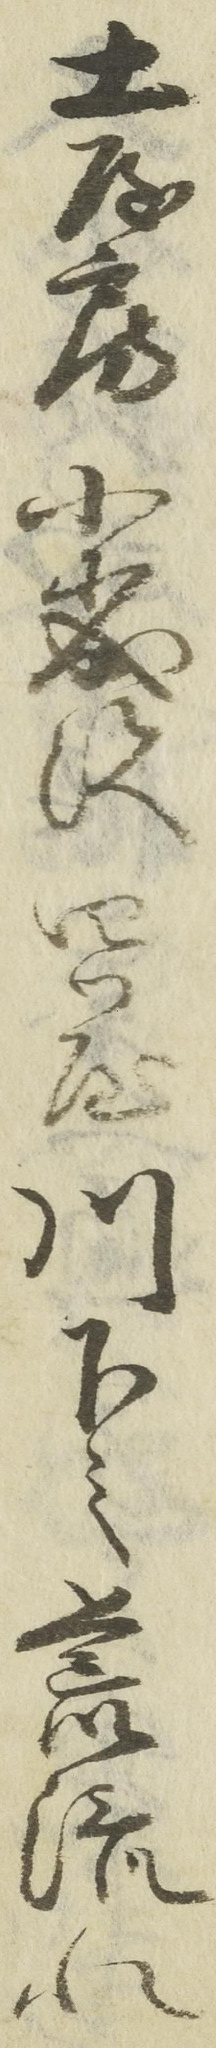土存？房小森沢四ッ屋川下之荒流れ
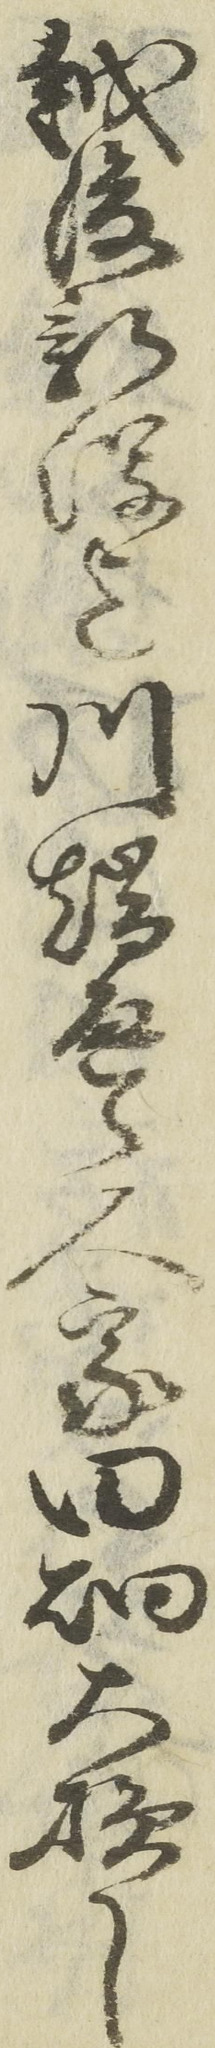越後新潟迄川端通り人家田畑大損し
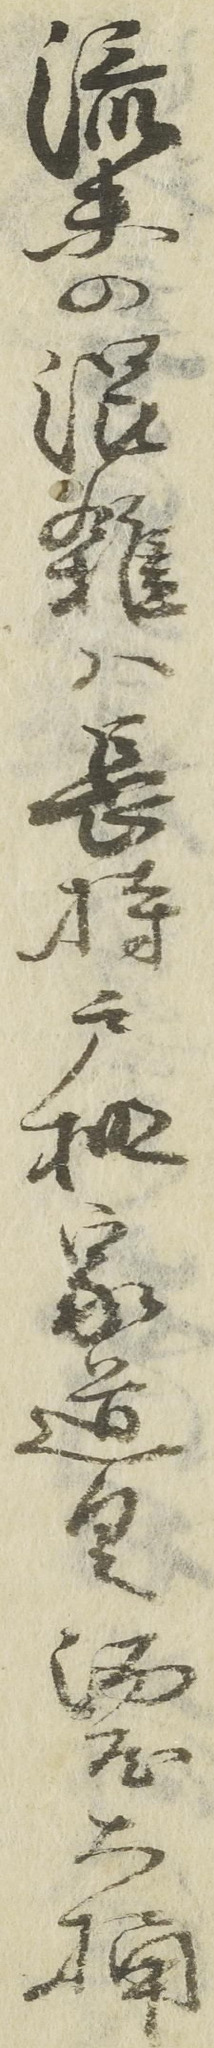流末の混雑ハ長持戸棚家道具酒屋大桶
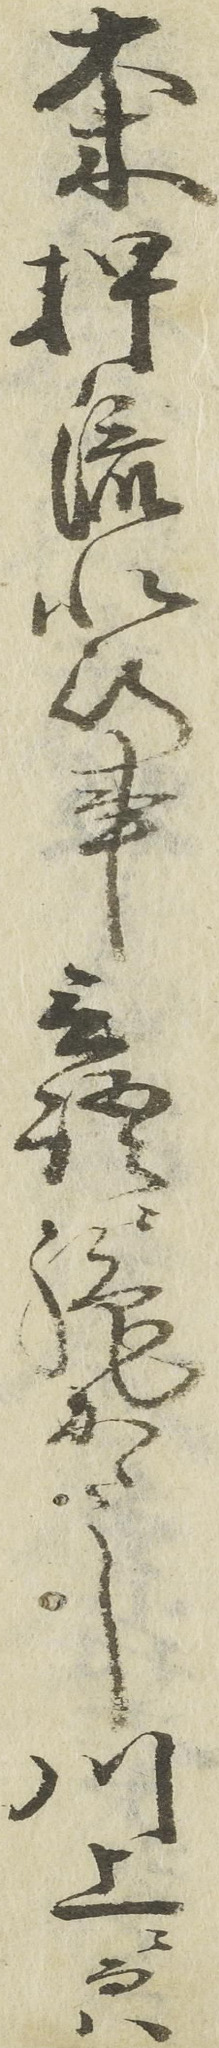大木押流れ行事言語ニ絶かたし川上ニ而ハ
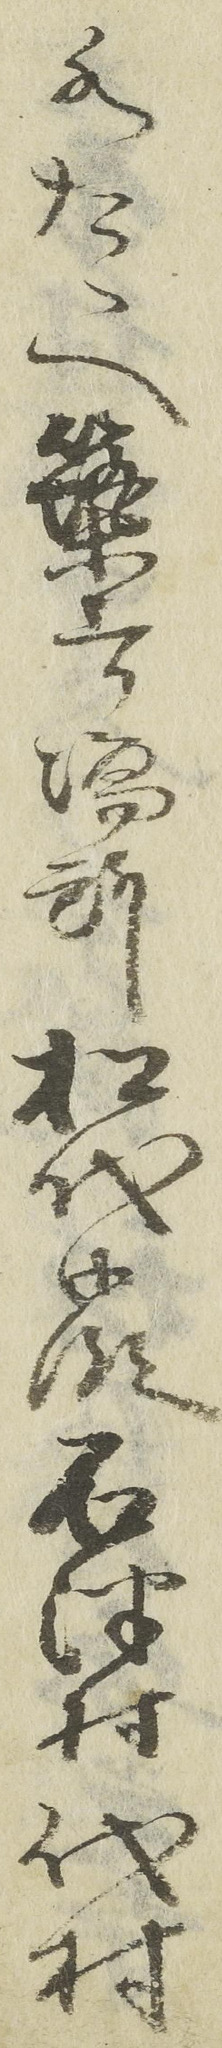水たゝへ築上り場所松代崩？石津村代村
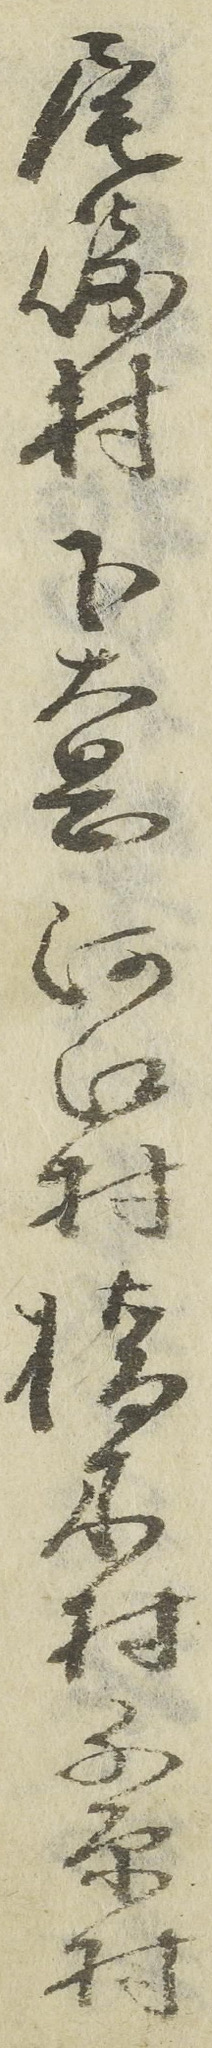尾崎村下大岡河江村橋木村千原村

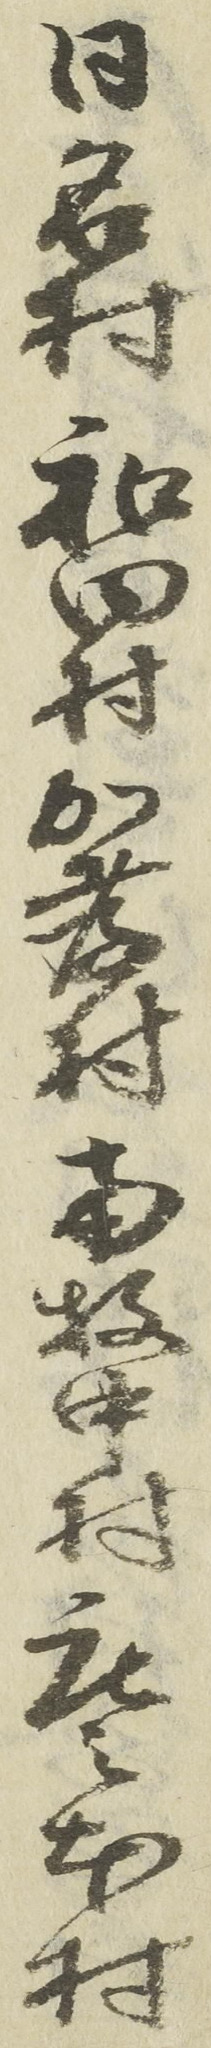日名村和田村加孝村南牧中村庄之本村
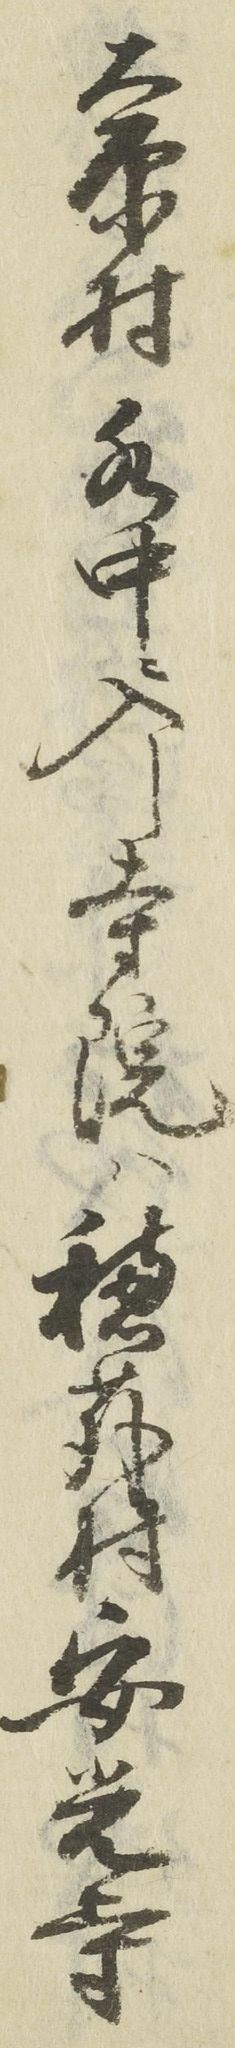大原村水中ニ入し寺院ハ穂刈村安光寺
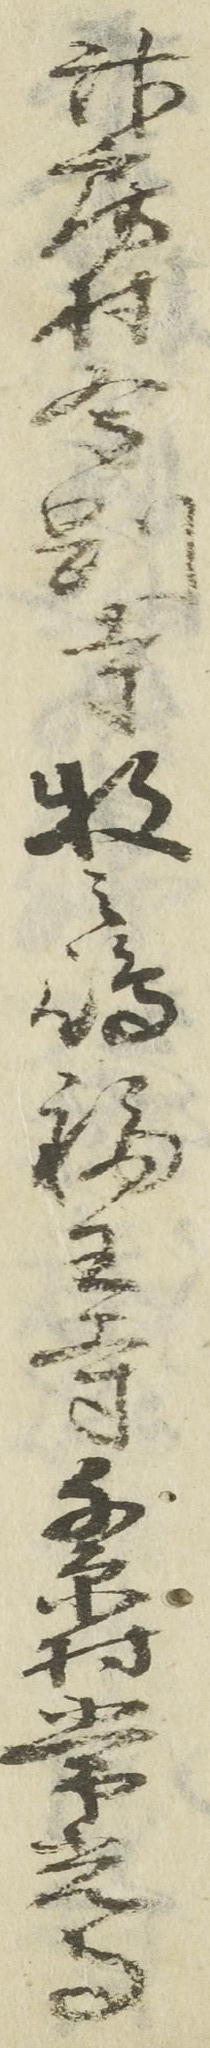神？房村金剛寺牧之嶋福王寺千原村常光寺
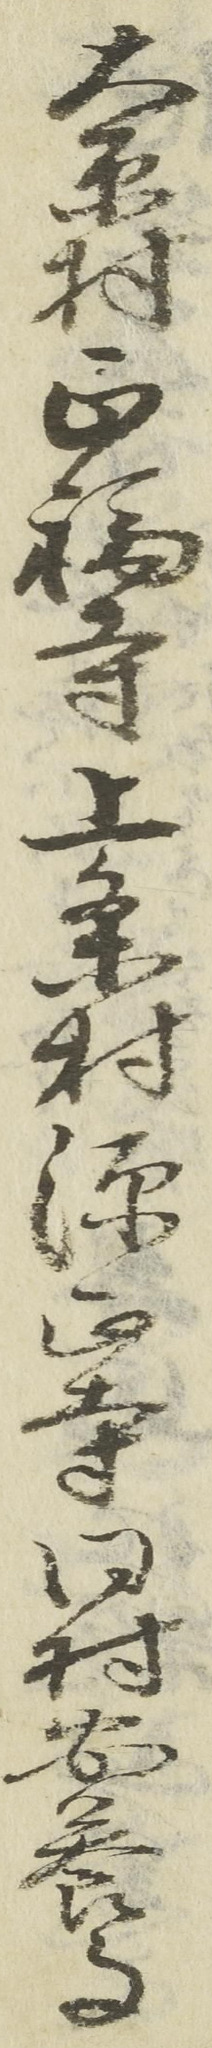大原村正福寺上条村源正寺同村安養寺
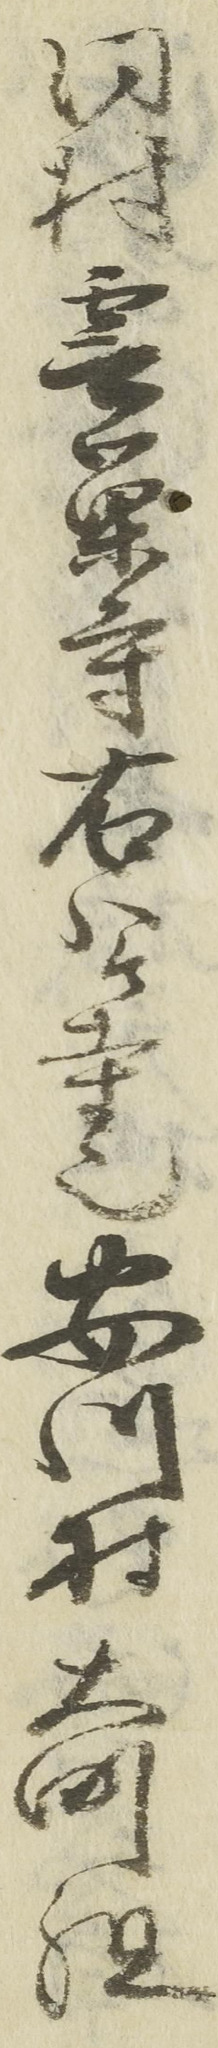同村雲巣？寺右八ヶ寺迄安川村大町組
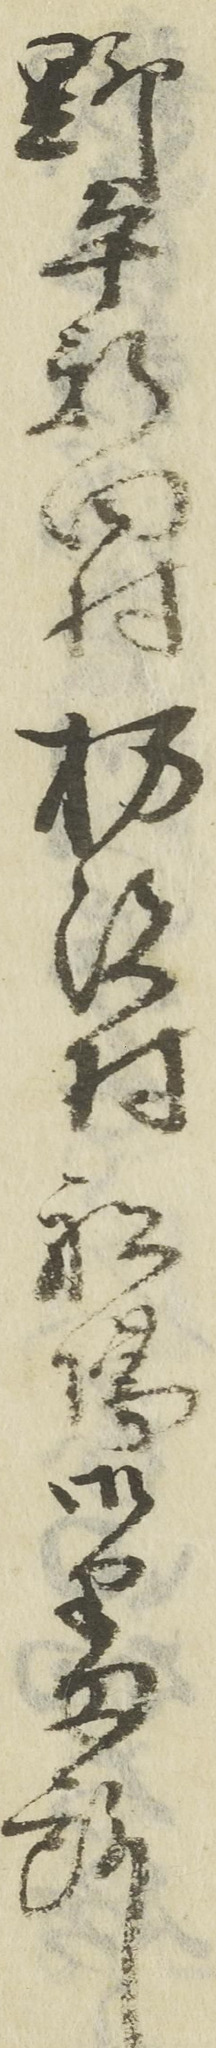野平新町村栃沢村船場御番所
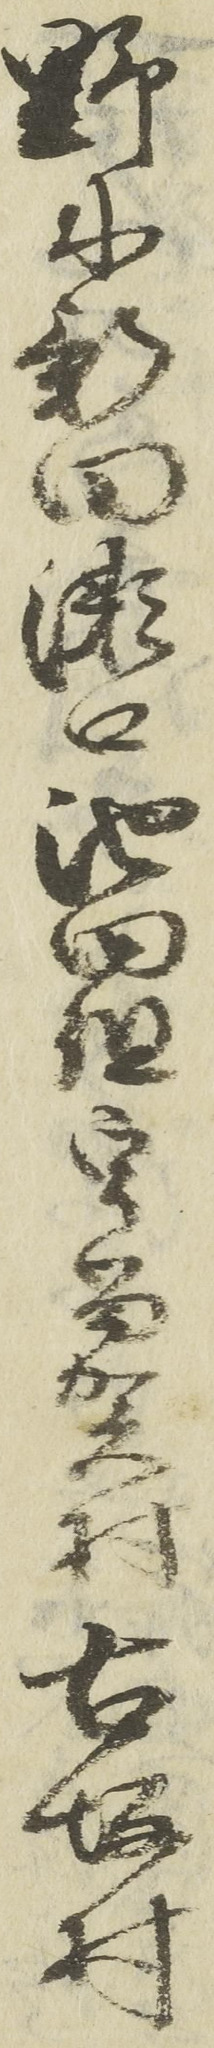野木新田瀬口池田組宇留賀村古坂村
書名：弘化四　大地震由来　全
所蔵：東京大学地震研究所図書室 Earthquake Research Institute Library, The University of Tokyo, JAPAN
